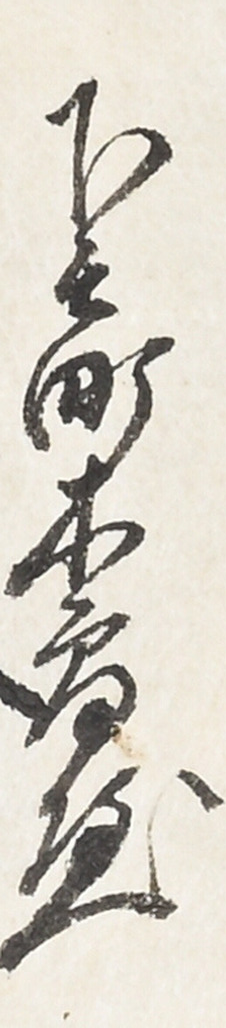下モ町木曽屋
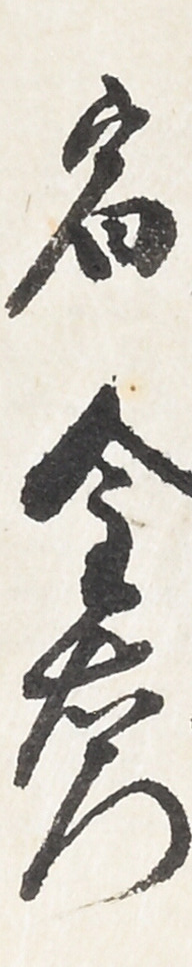宿金右衛門
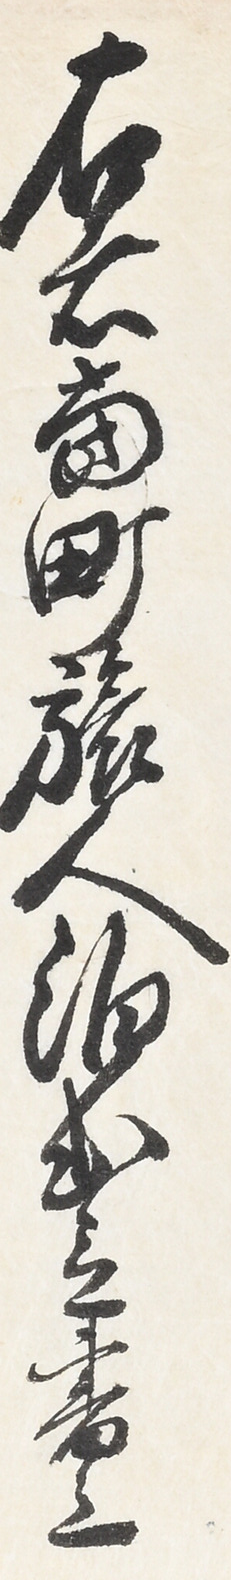右者当町旅人泊出立書上
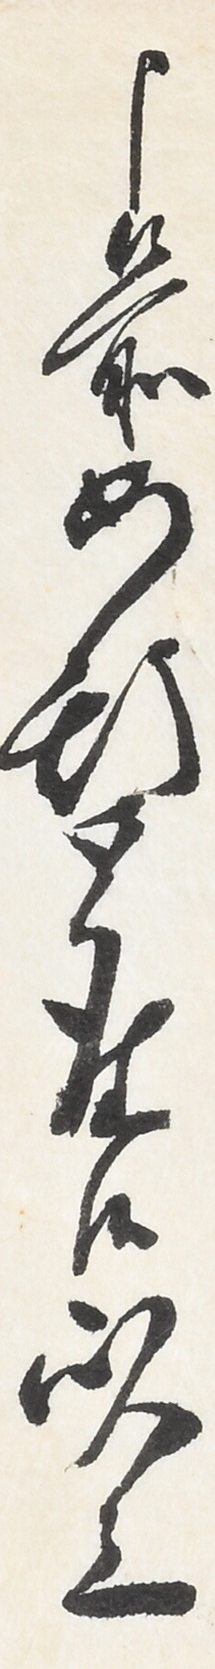申候所如斯御座候以上
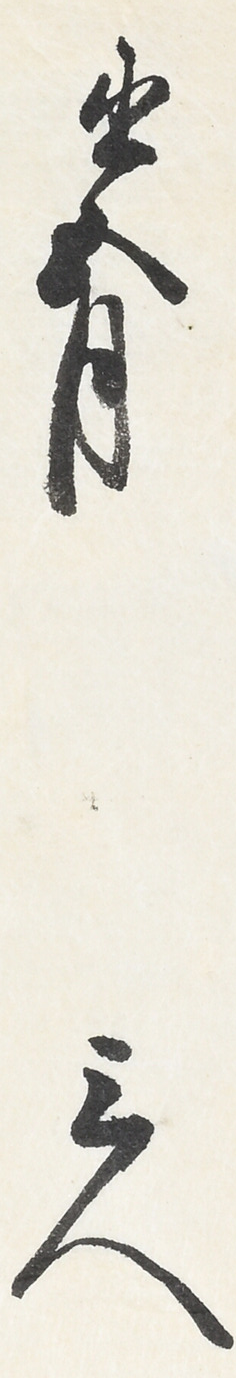丑五月三人
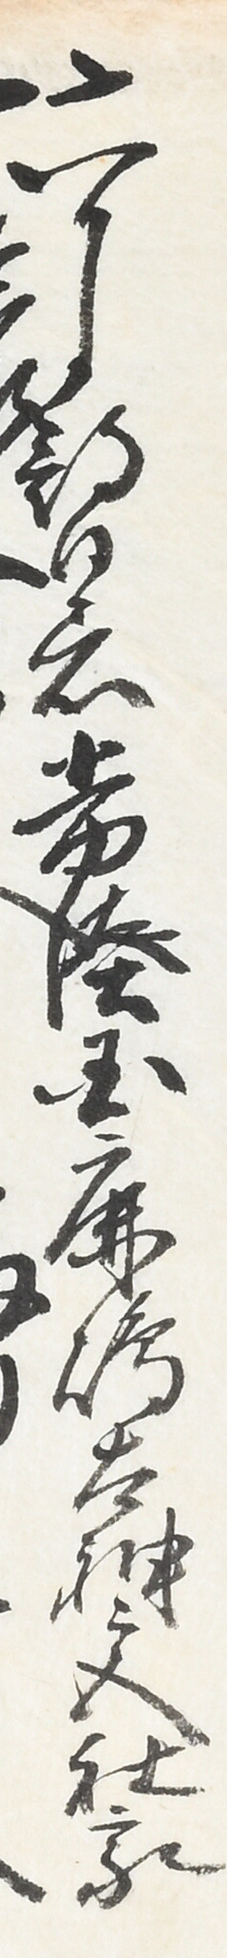六月朔日着常陸国鹿嶋太神宮社家
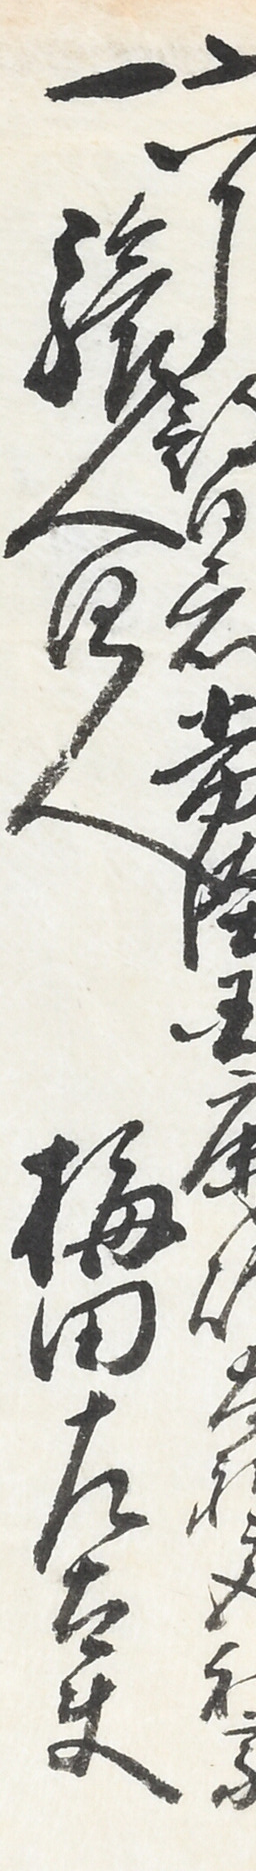一旅人四人梅田左大夫
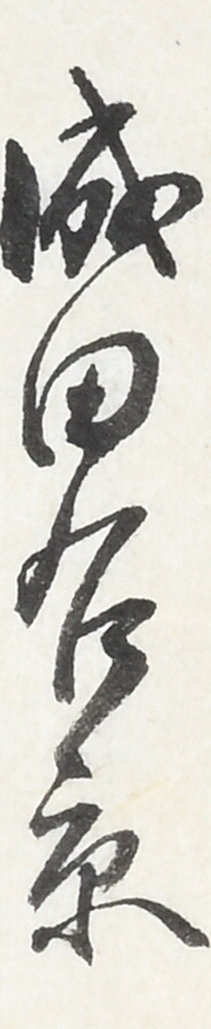成田右京
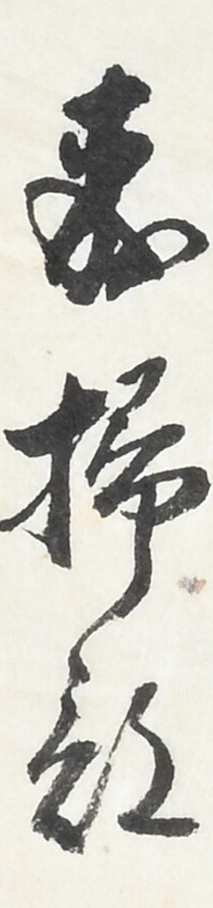森掃部
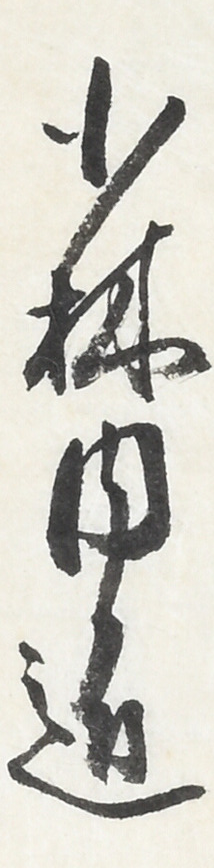小林内近

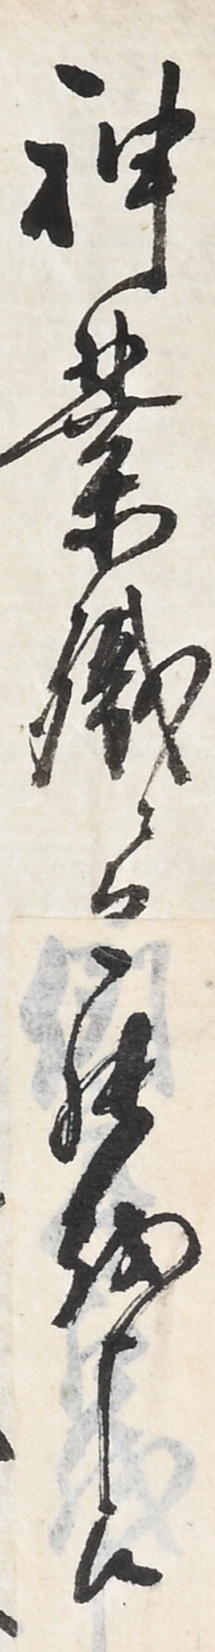神業職ニ而罷越申候
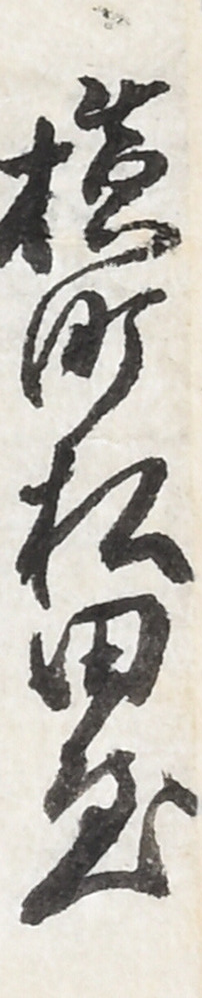横町松田屋
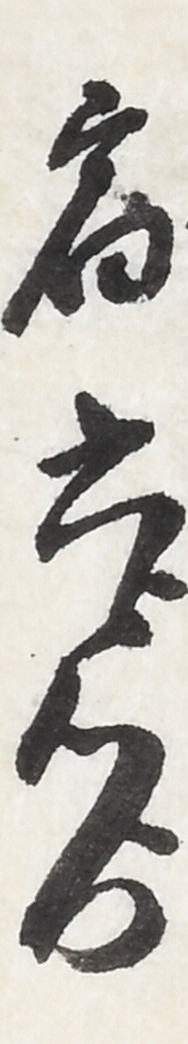宿六郎右衛門
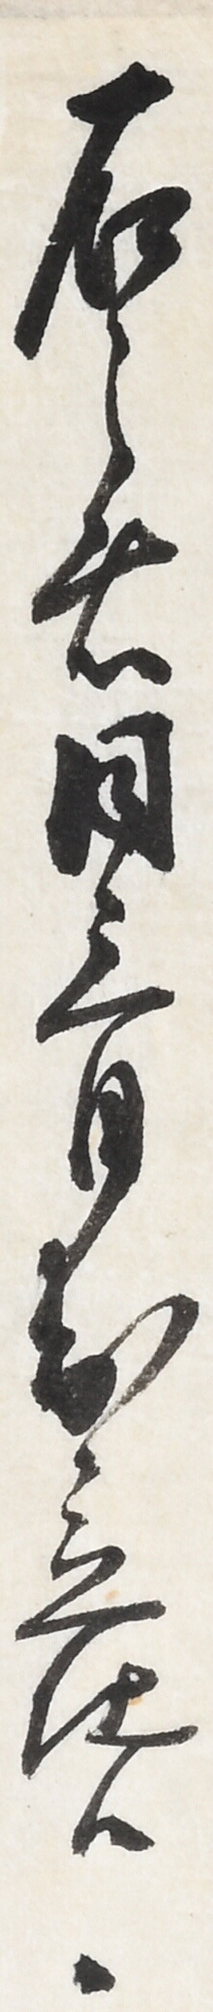右之者同三日出立仕候・
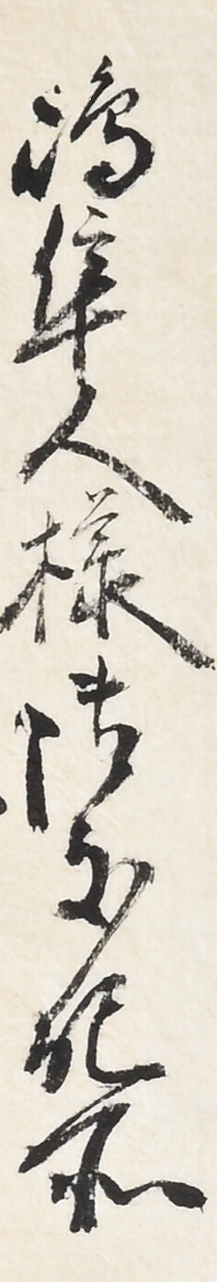嶋隼人様御支配所
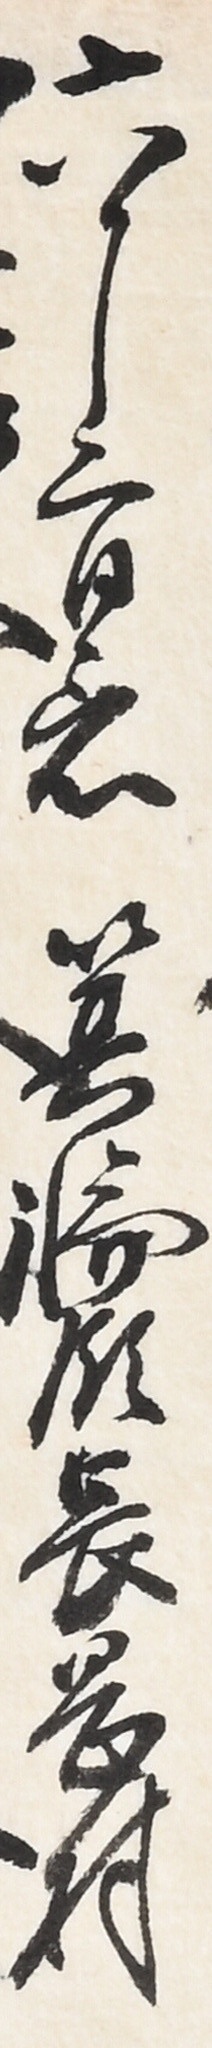六月二日着箕輪領長岡村
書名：旅人泊控帳
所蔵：伊那市立高遠町図書館・合同会社AMANE
